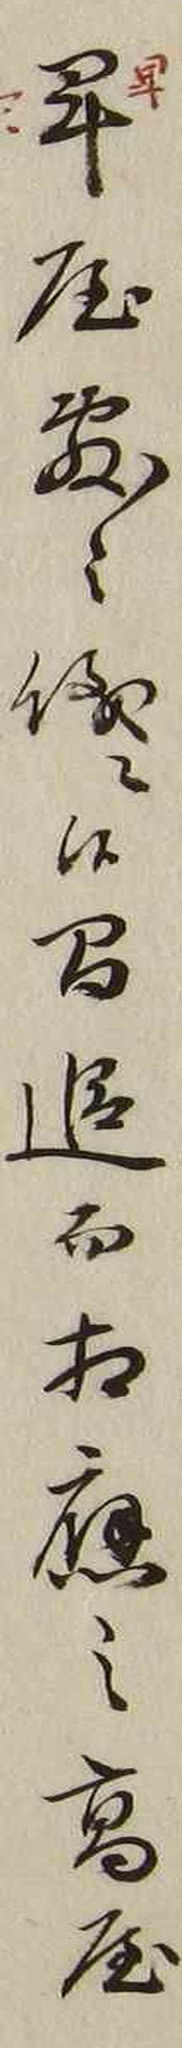旱屋敷之儀ニ候間追って相応之高屋
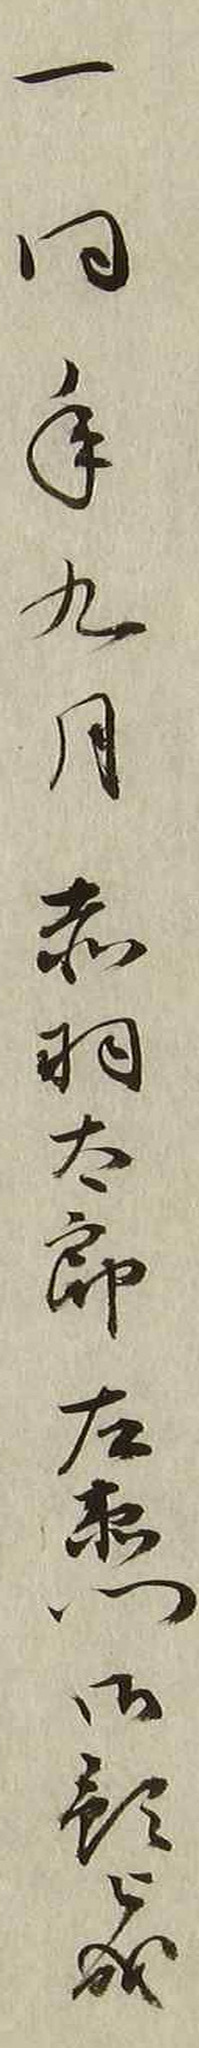一同年九月赤羽太郎左衛門御預け成られ
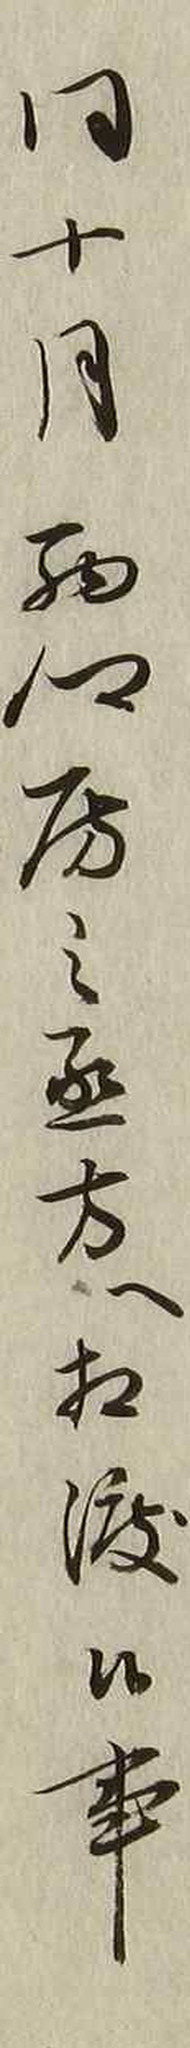同十月西郷房之丞方へ相渡し候事
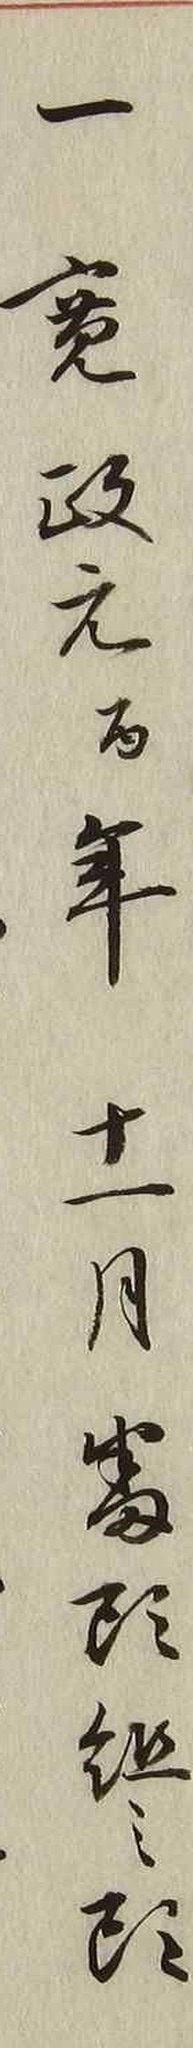一寛政元酉年十一月番頭組之頭
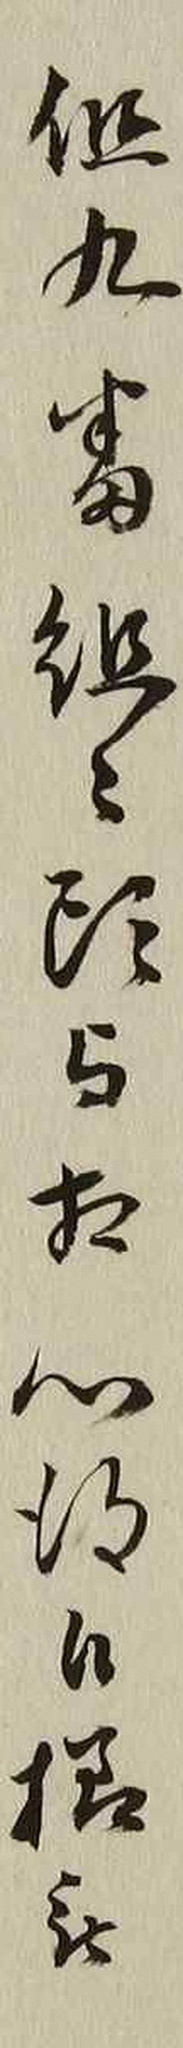但し九番組ニ頭と相心得候様
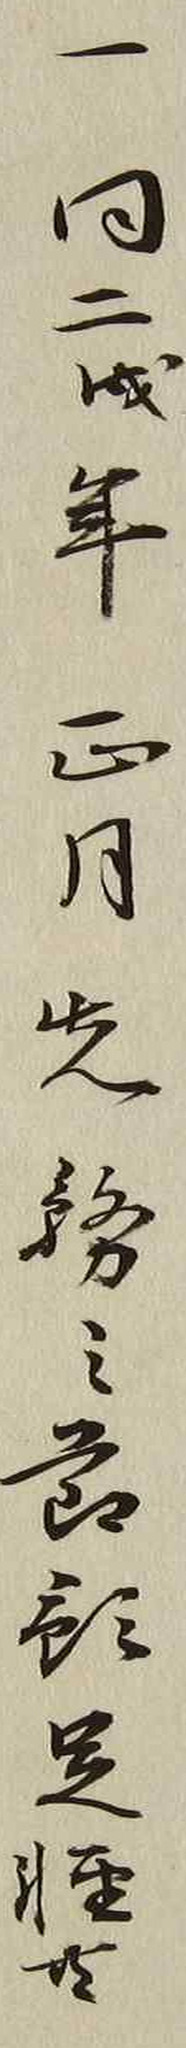一同二戌年正月先努之節預り足軽共
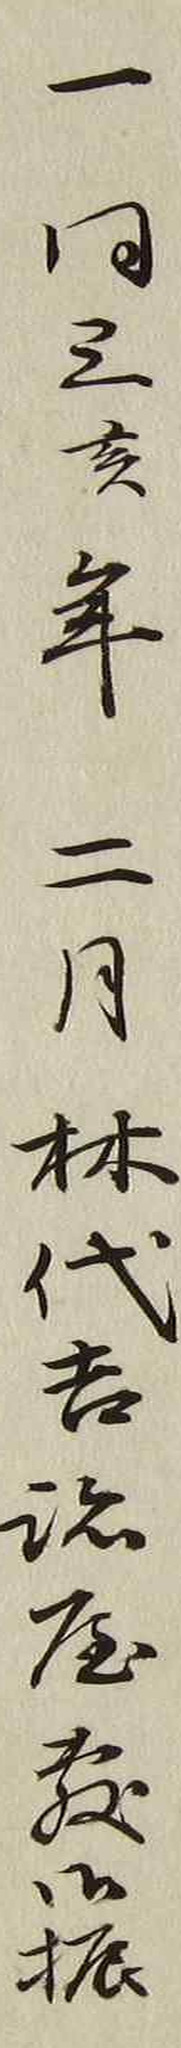一同三亥年二月林代吉諸屋敷御振
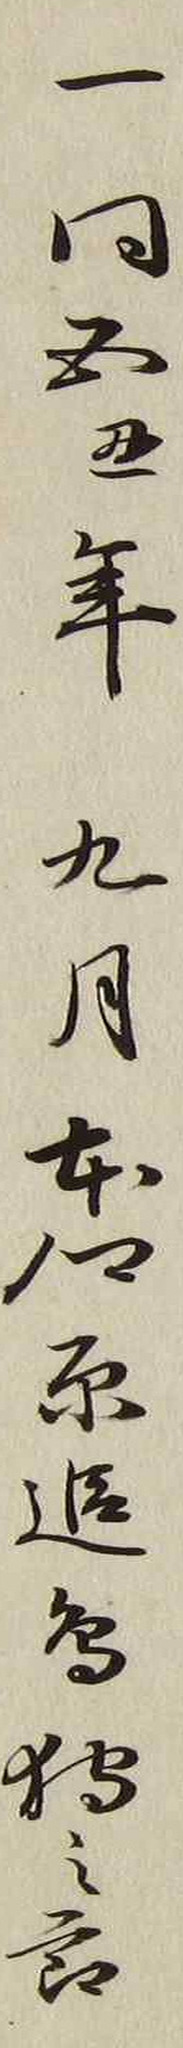一同五丑年九月本郷原追鳥狩之節

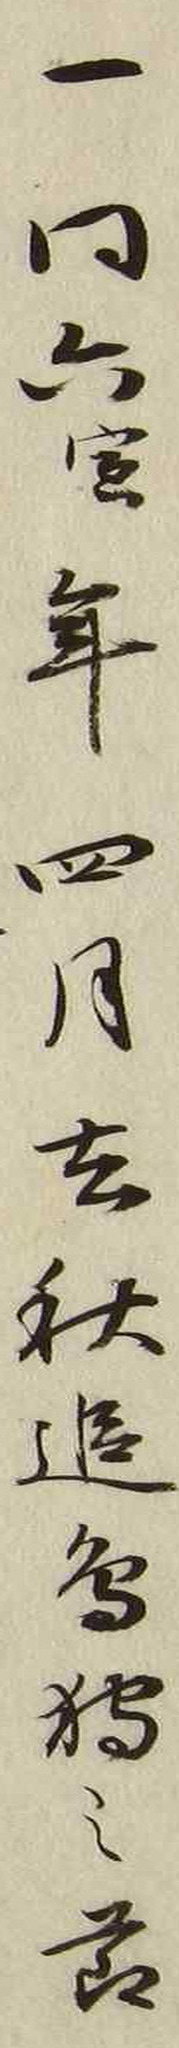一同六寅年四月去る秋追鳥狩之節
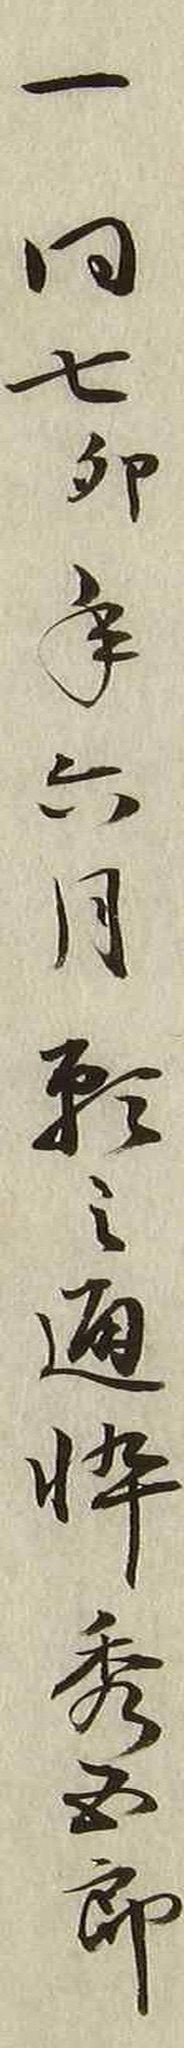一同七卯六月願い之通り倅秀五郎
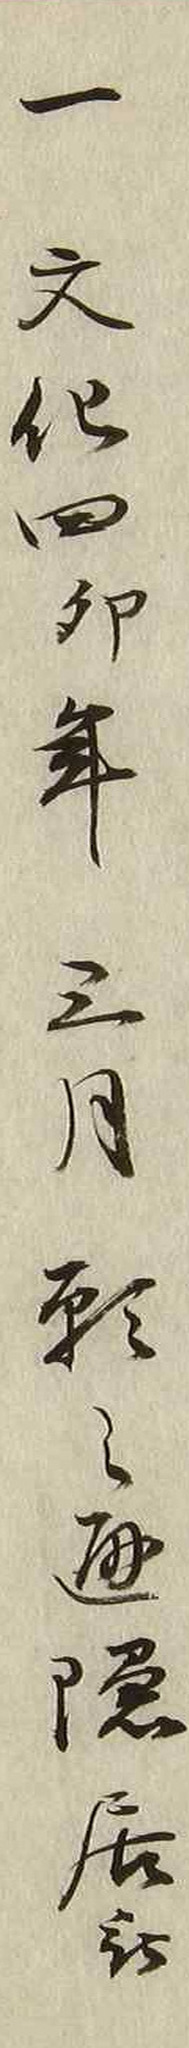一文化四卯年三月願い之通り隠居
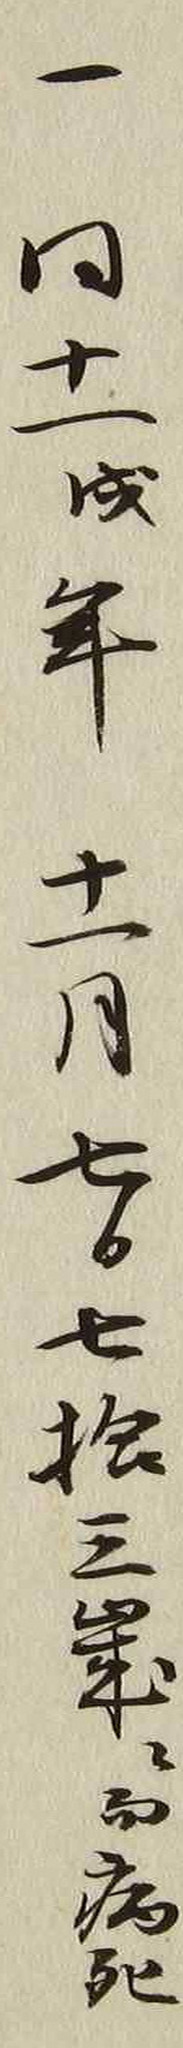一同十一戌年十一月七日七拾三歳ニて病死
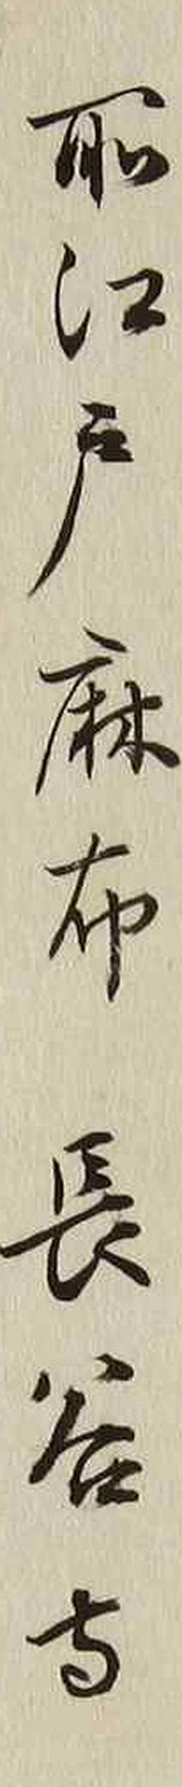所江戸麻布長谷寺
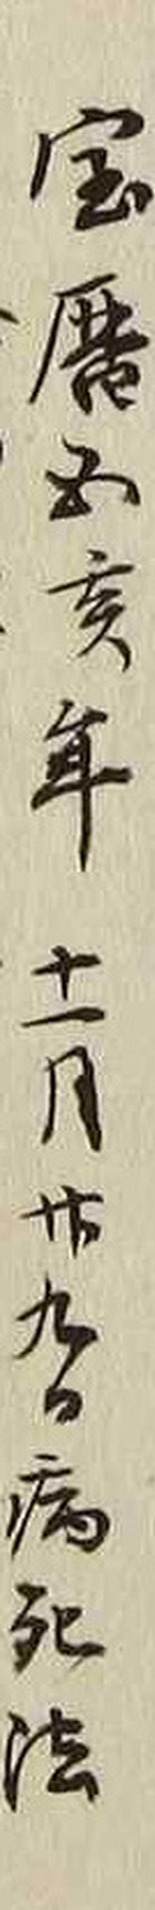男宝暦五寅年十一月廿九日病死法
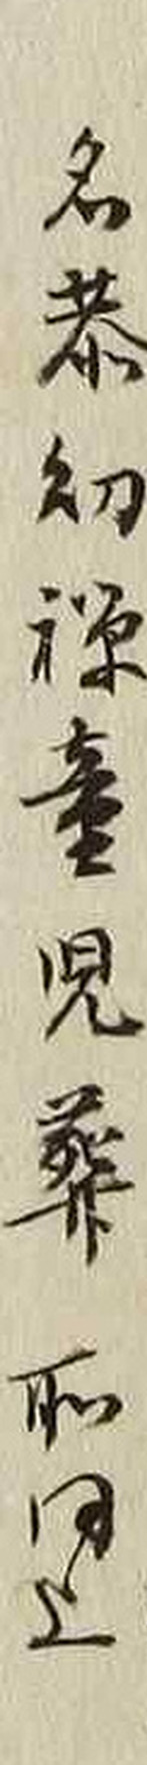名恭幼禅童児葬所同上
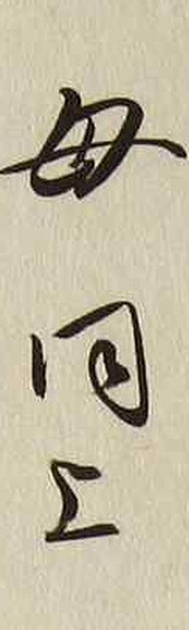母同上
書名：諸士系譜　巻之16　い之部16
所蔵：会津若松市立会津図書館
